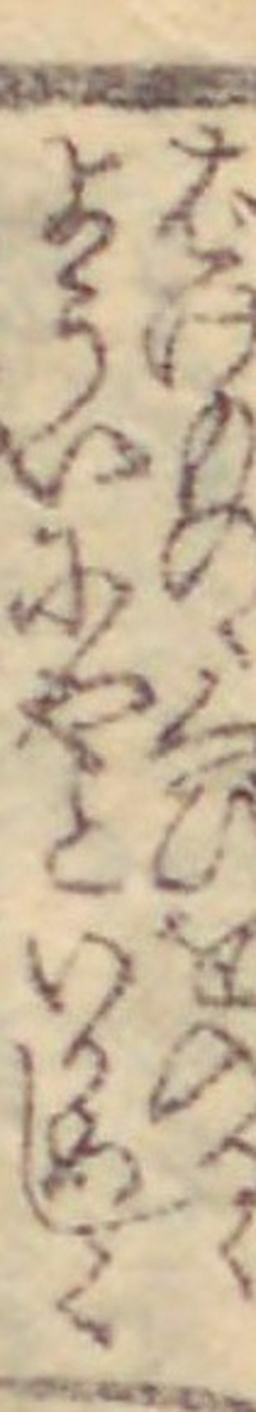よういにやといかめしく
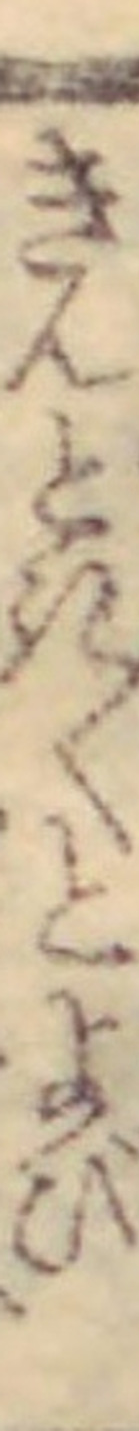きんとき〳〵とよび
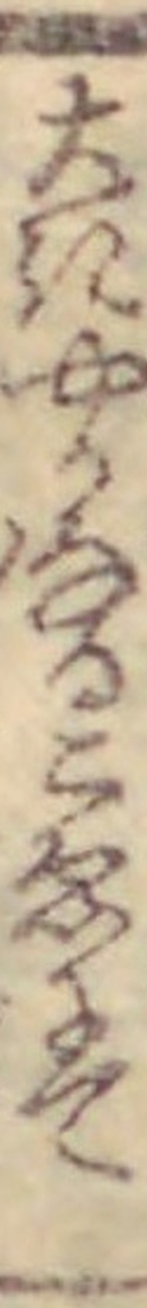大きやうなるこゑにて
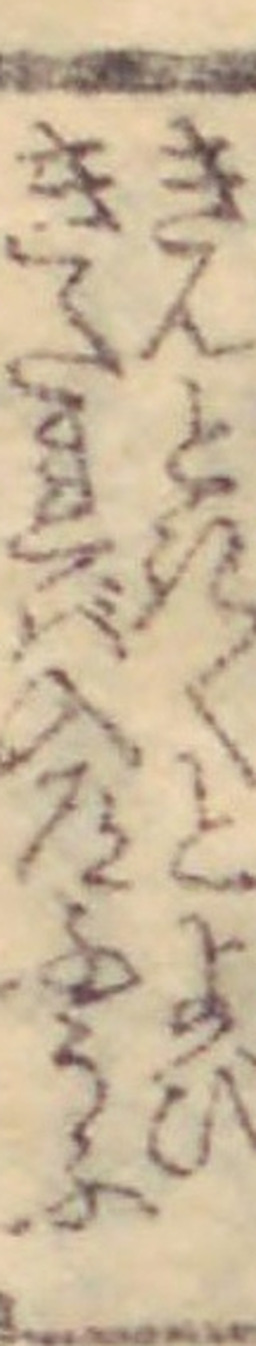きたれば入道ふうふ
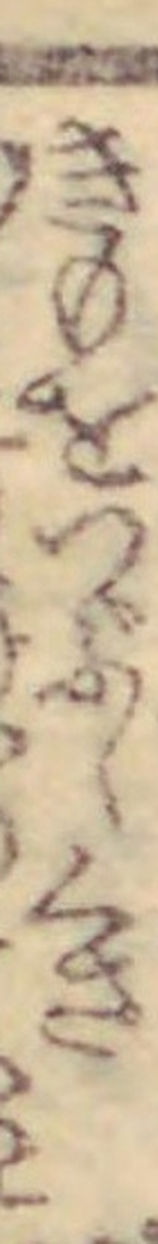きもをつぶしくさ
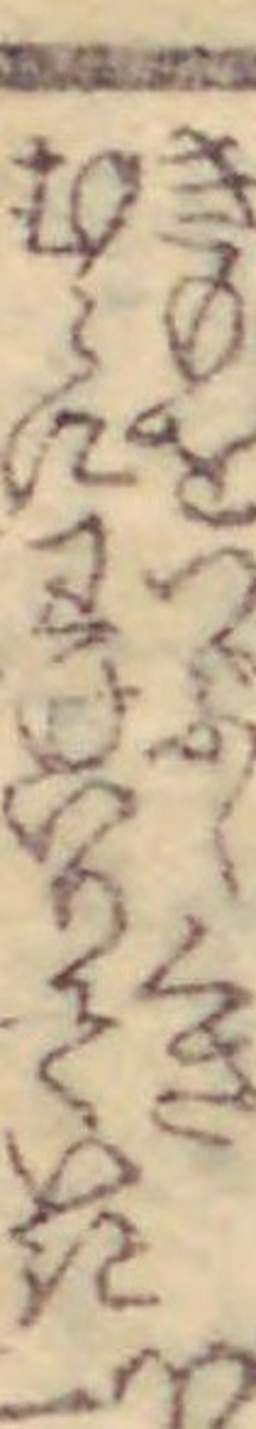むらにわけいりていき

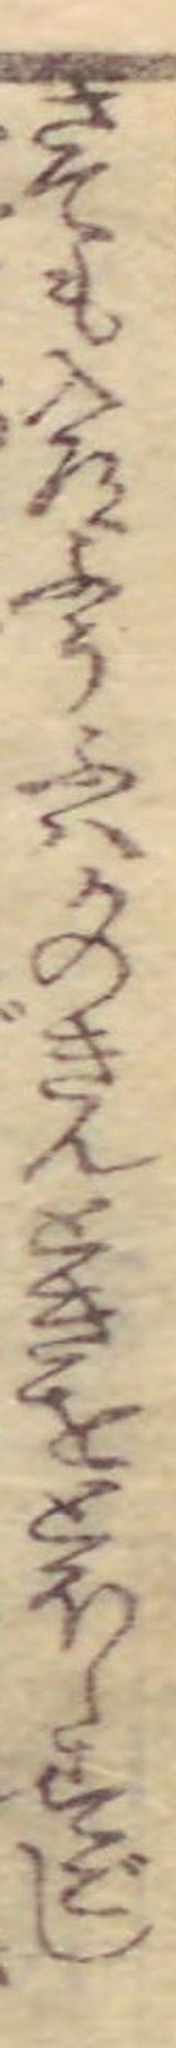さても入道ふうふはかのきんときをとほしすごし
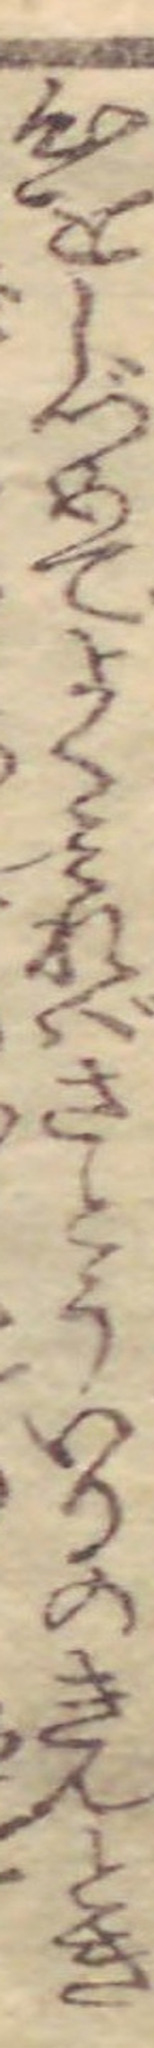心をしづめてよくみればさとういりのきんとき
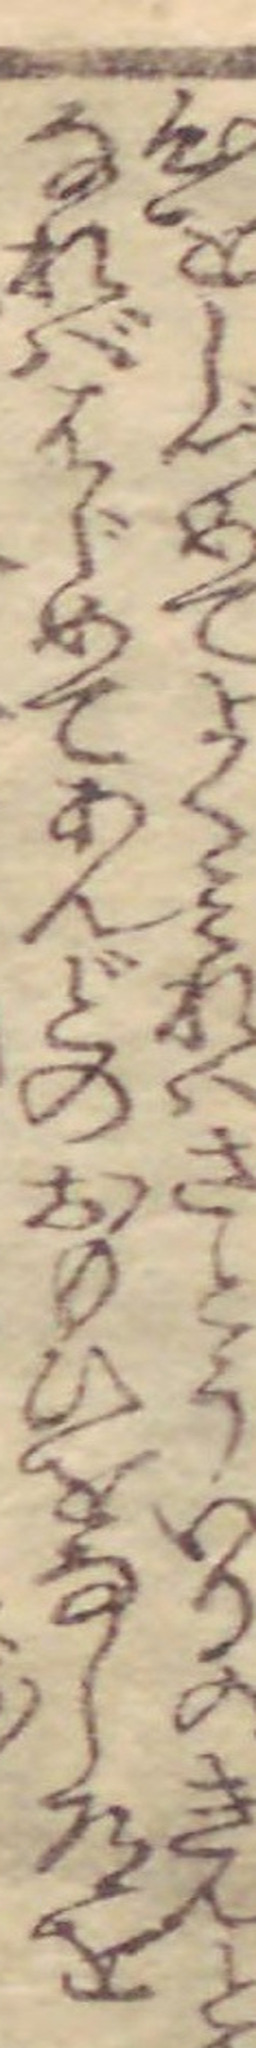なればはじめてあんどのおもひをなし道を
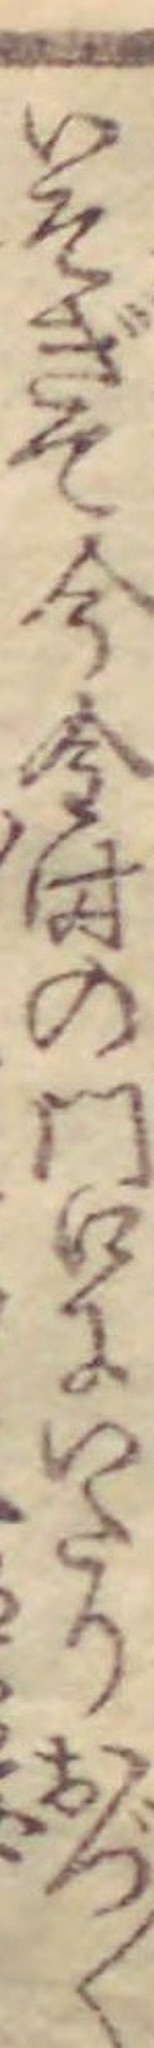いそぎて今金時の門口にいたりおづ〳〵
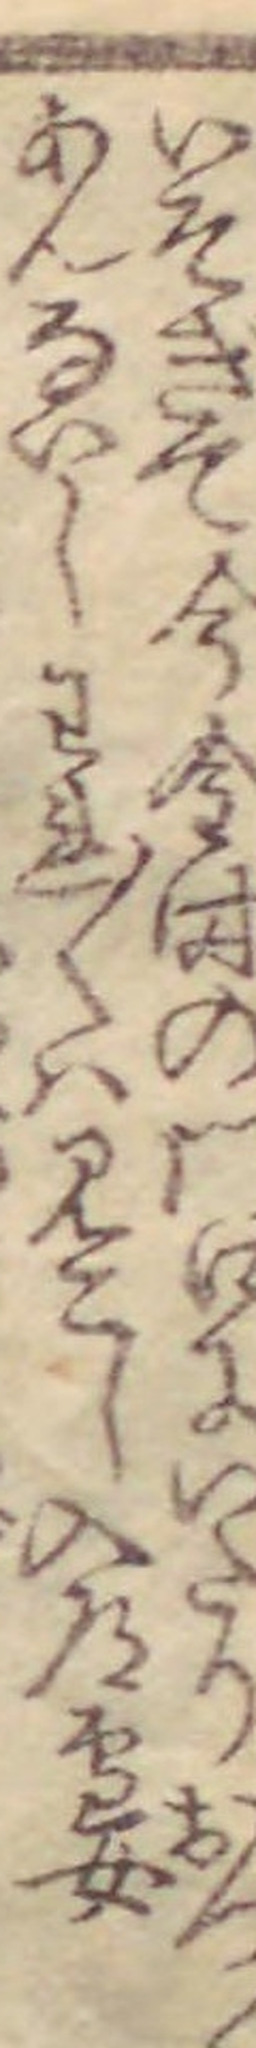あんないしわれ〳〵は見こし入道雪女
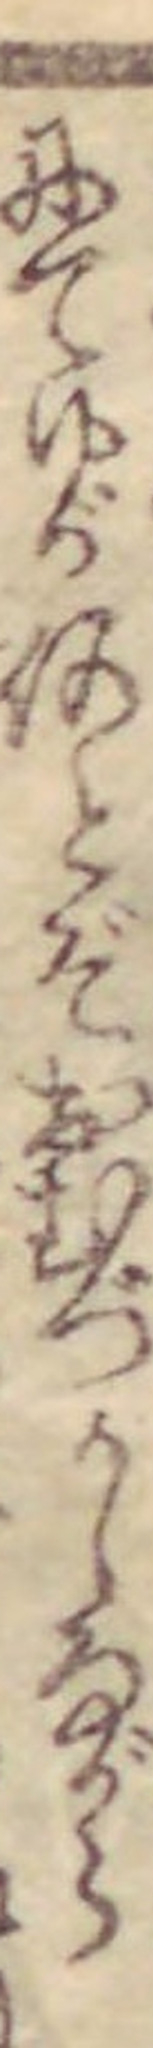にて候が何とぞおむづかしながら
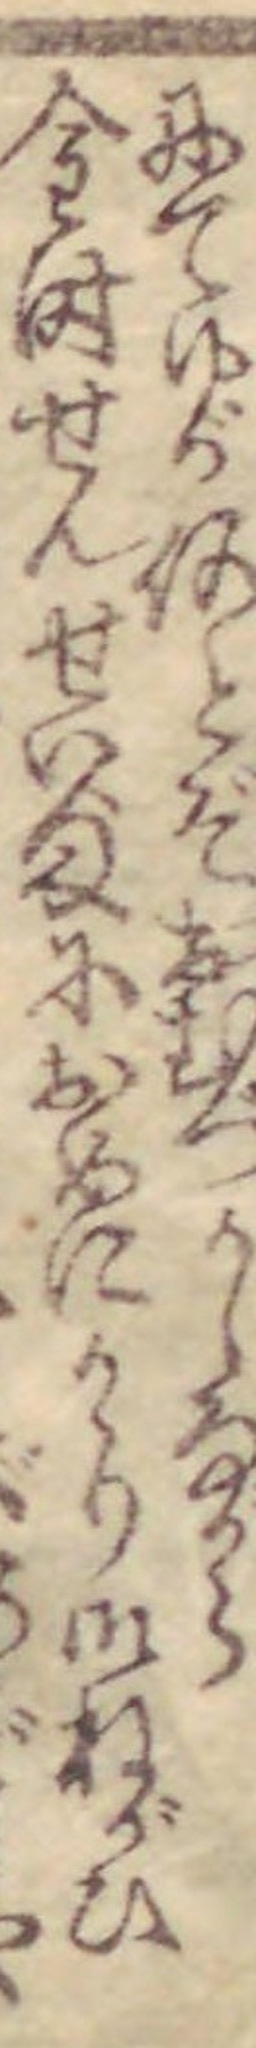金時せんせいさまにおめにかかり御ねがひ
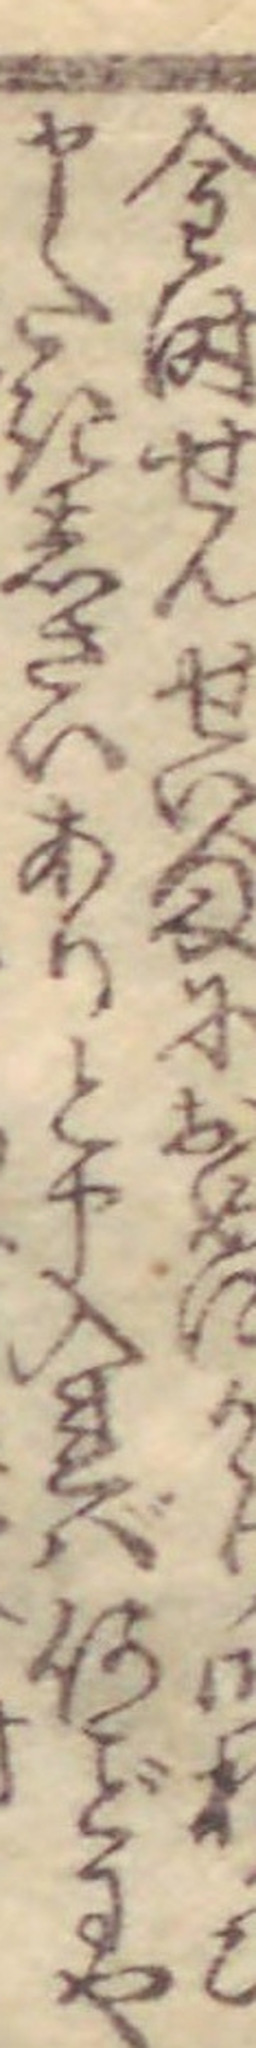申したきしさいありと申入れば何ごとにや
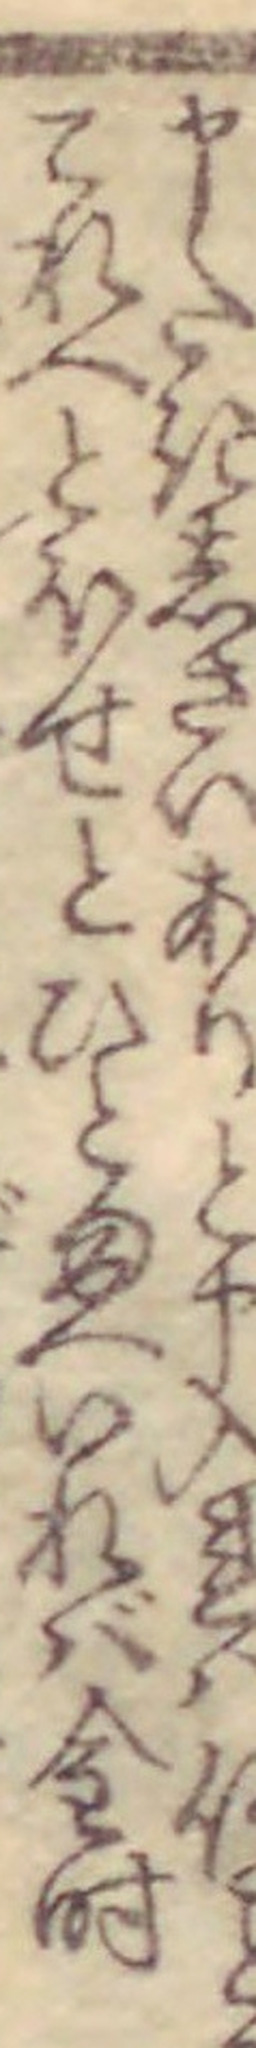これへとほせとひとまへいれば金時
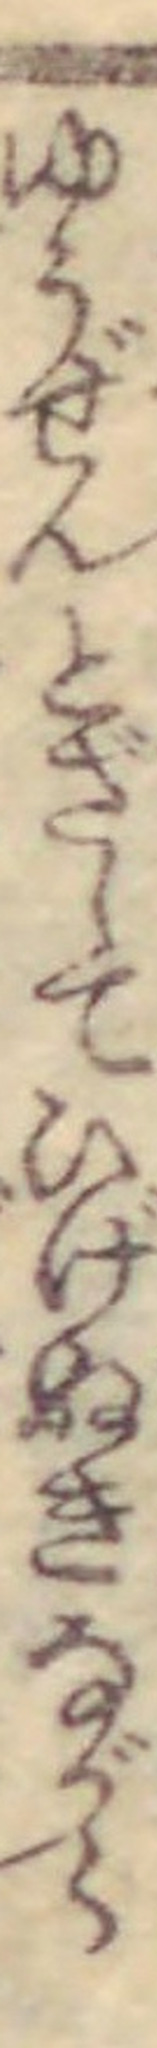ゆうぜんとざしてひげぬきながら
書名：化物世帯氣質
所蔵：国立国会図書館 National Diet Library, JAPAN
